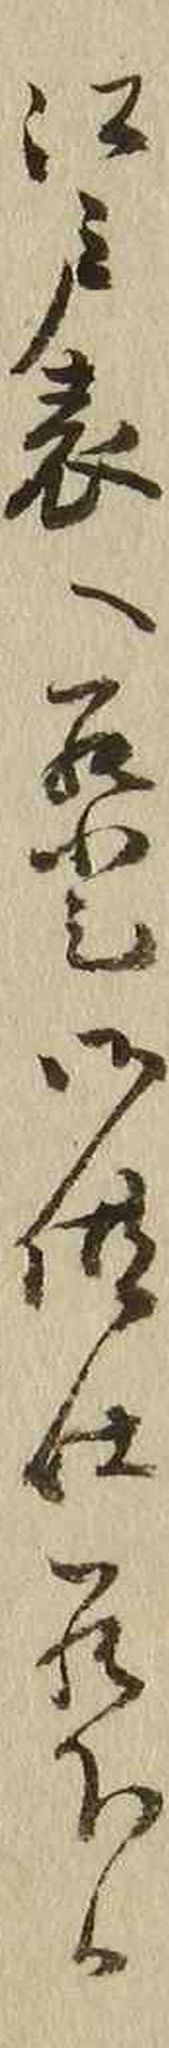江戸表へ罷登御供仕罷下候
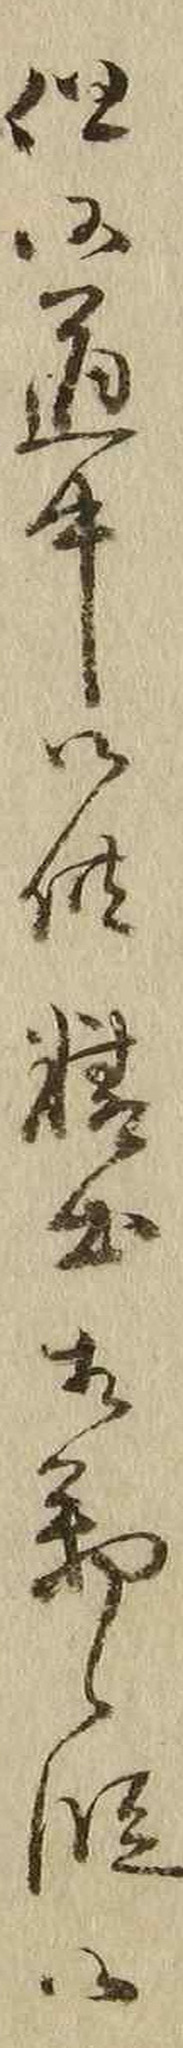但御道中御供精出相勤候段御
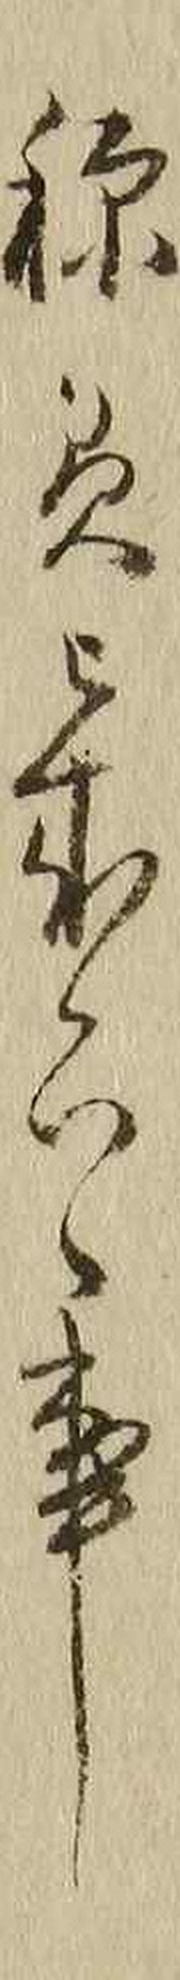称美被成下候事
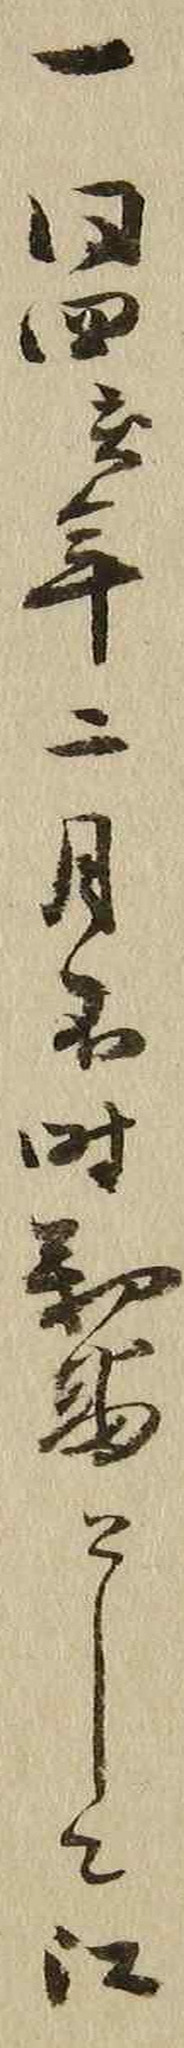一同四亥年二月不時勤番として江
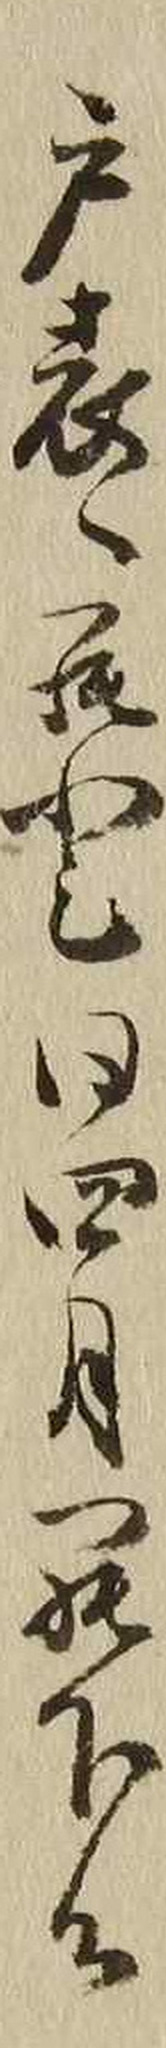戸表へ罷登同四月罷下候
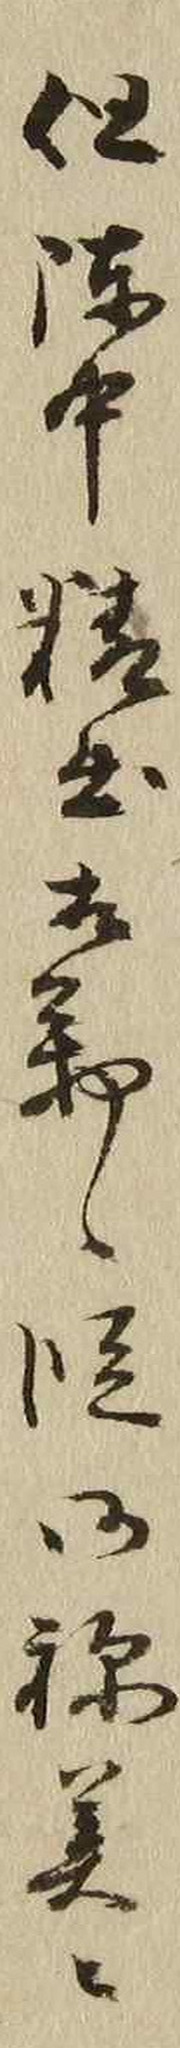但陣中精出相勤候段御称美被
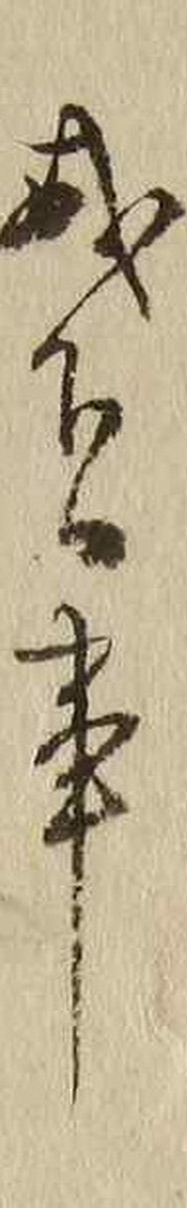成下候事
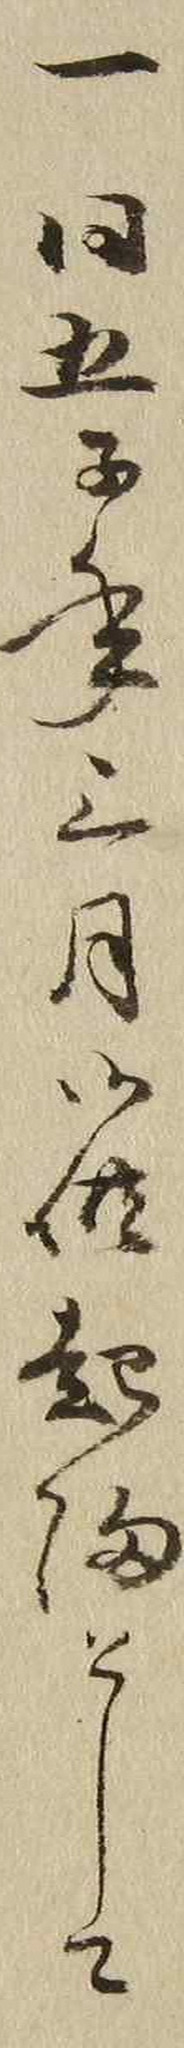一同五子年三月御供起帰として
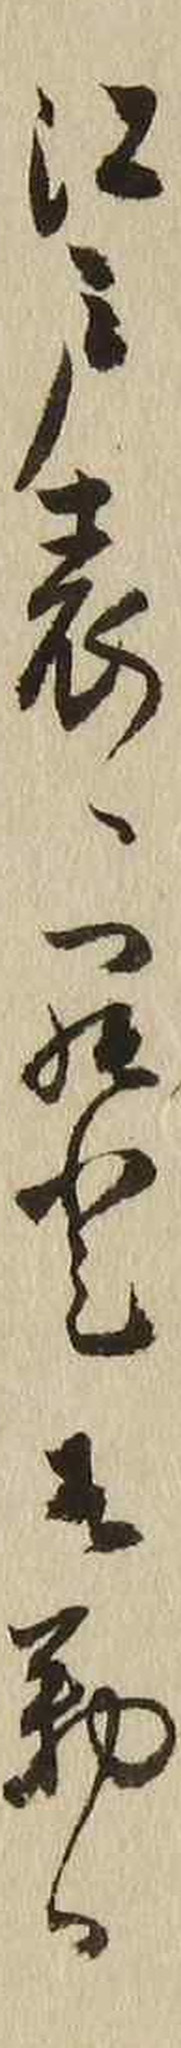江戸表へ罷登相勤候
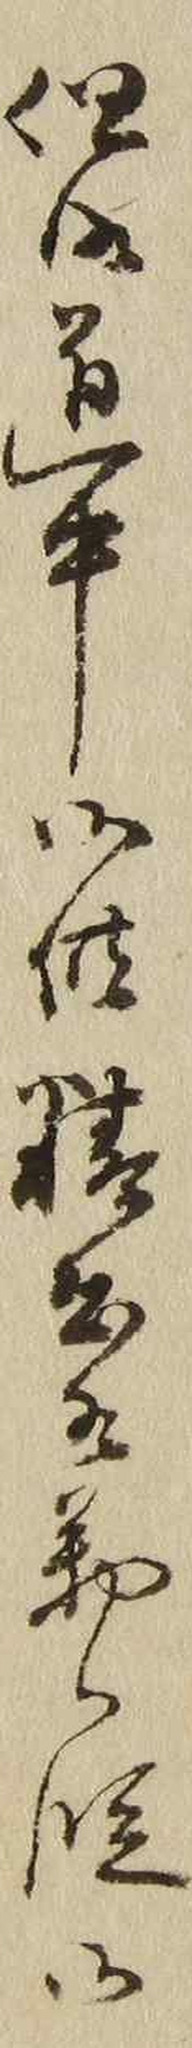但御道中御供精出相勤候段御
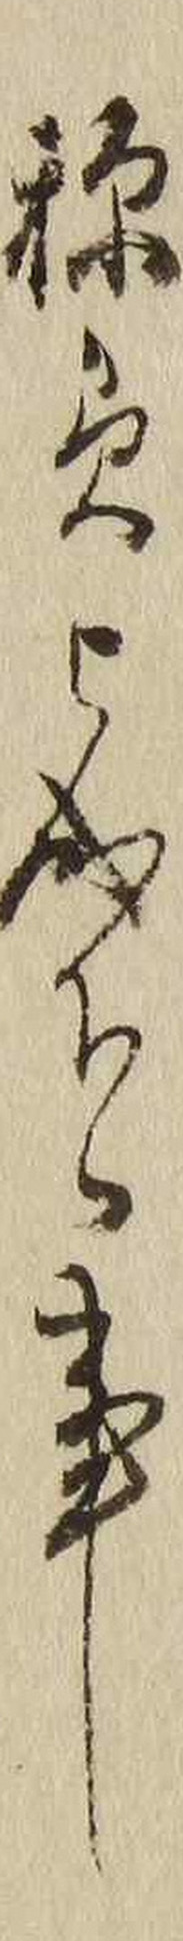称美被成下候事
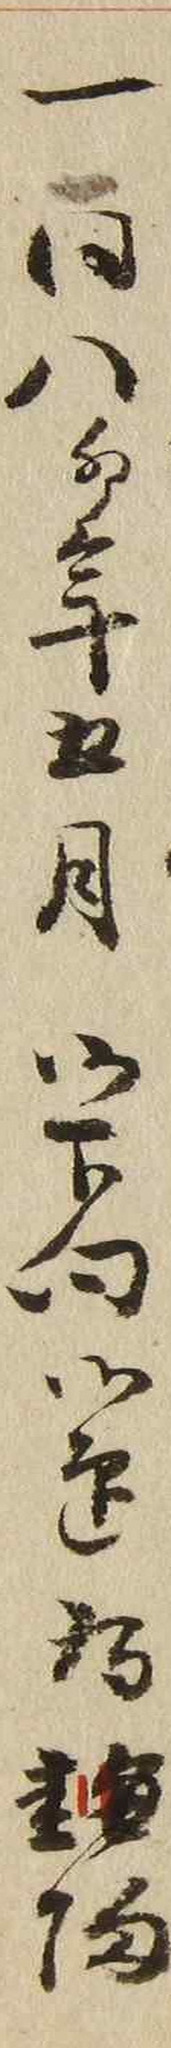一同八卯年五月御下向御迎為起帰
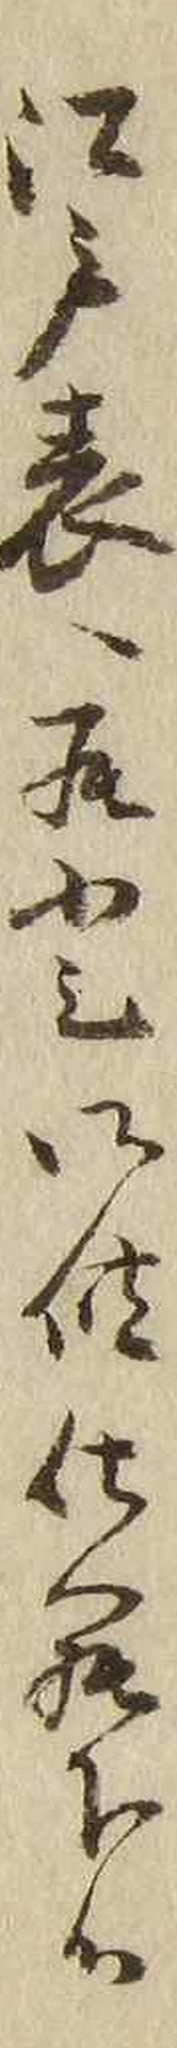江戸表へ罷登御供仕罷下候
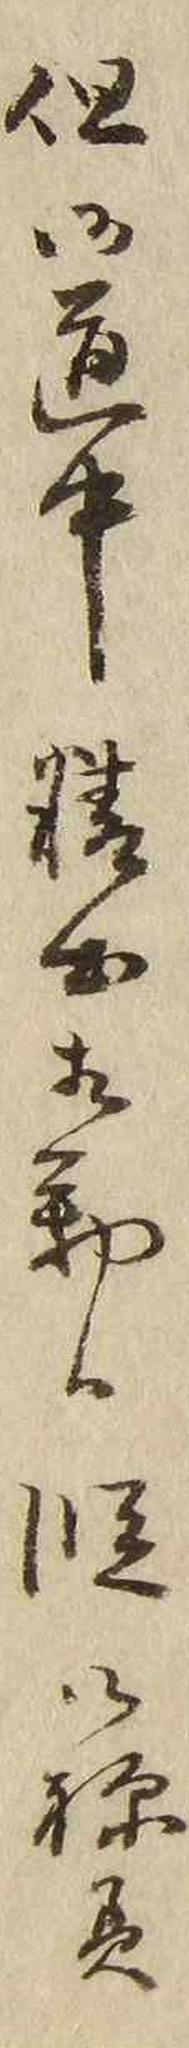但御道中精出相勤候段御称美

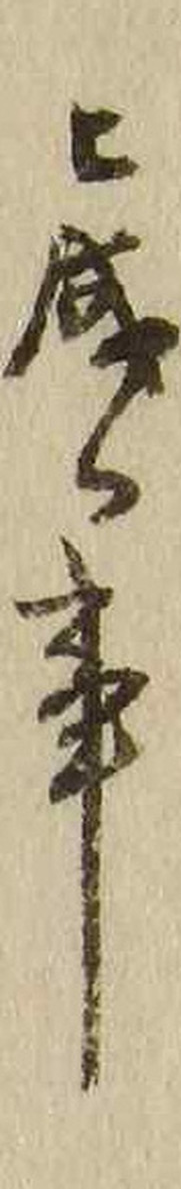被成候事
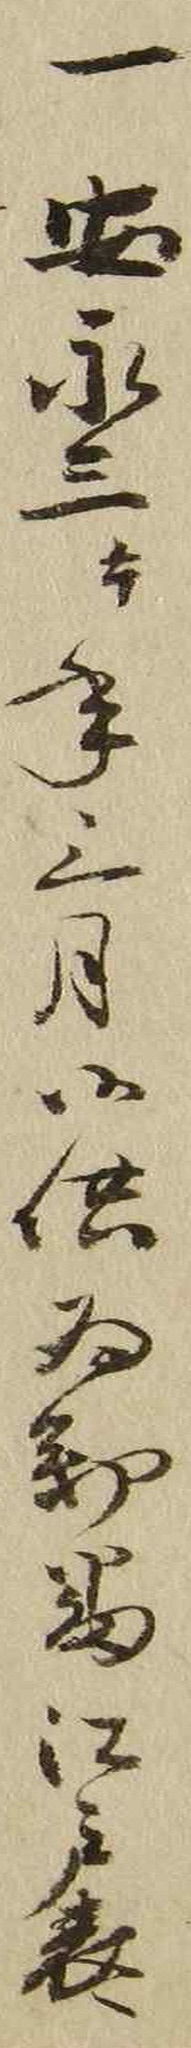一安永三午年三月御供為勤番江戸表へ
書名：諸士系譜　巻之232　け之部1
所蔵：会津若松市立会津図書館
